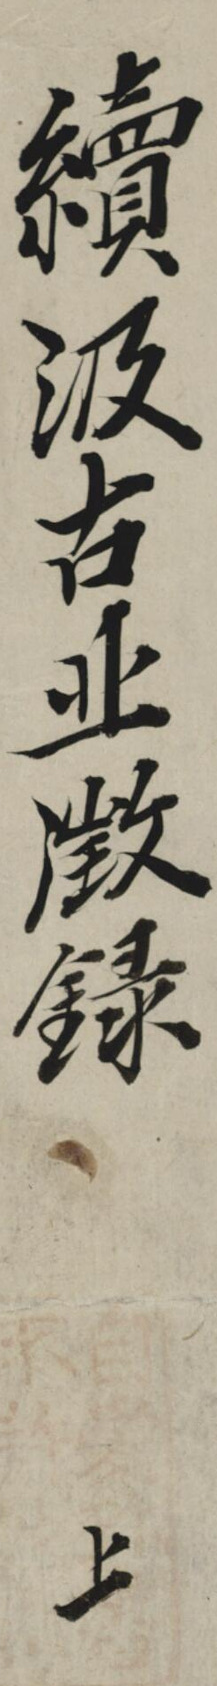續汲古北徴録上

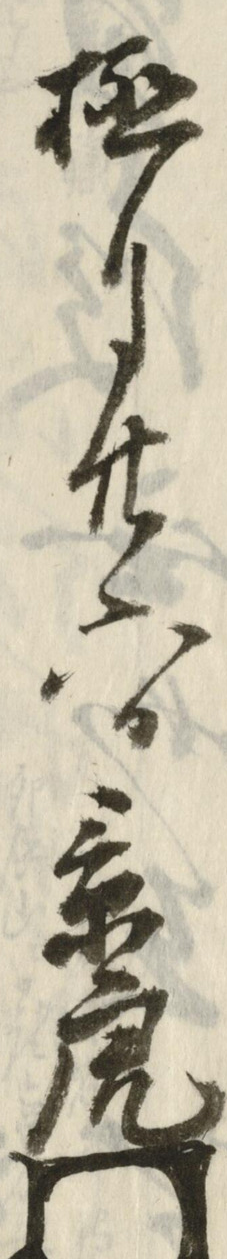極月廿六日景虎花押
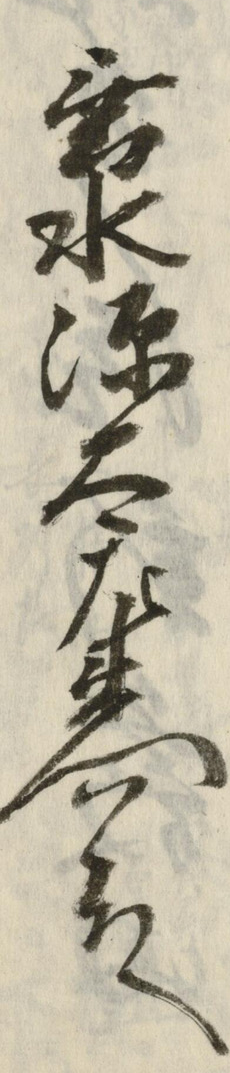垂水源太左衛門とのへ
